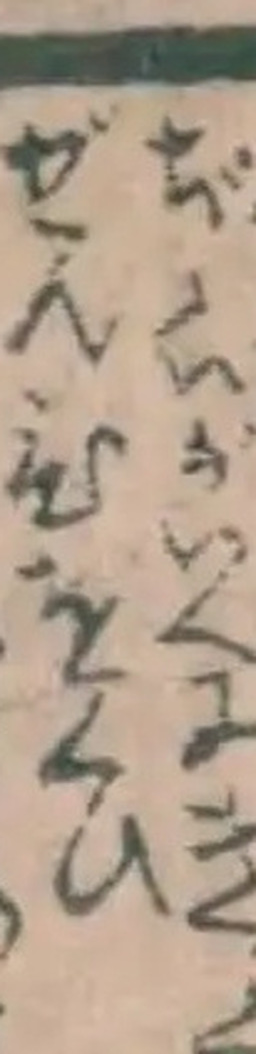ぜんひをくひ
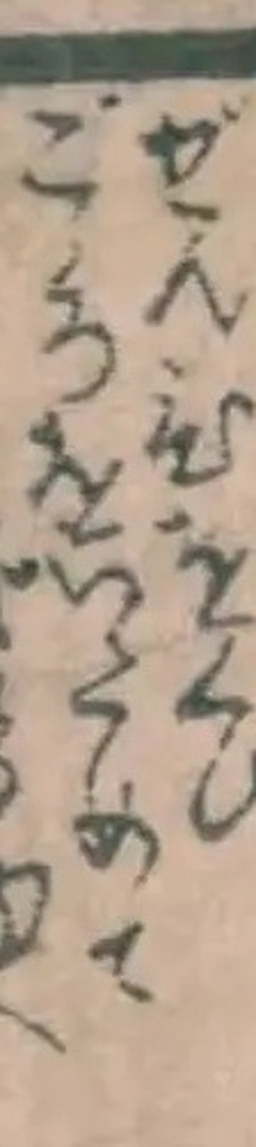こゝろをいためて
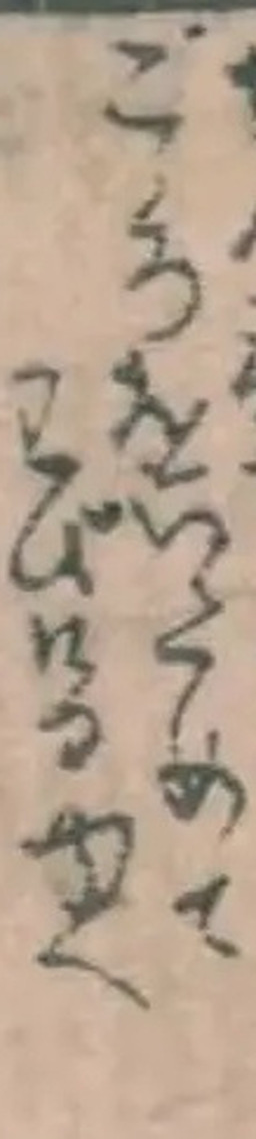わびけるゆへ
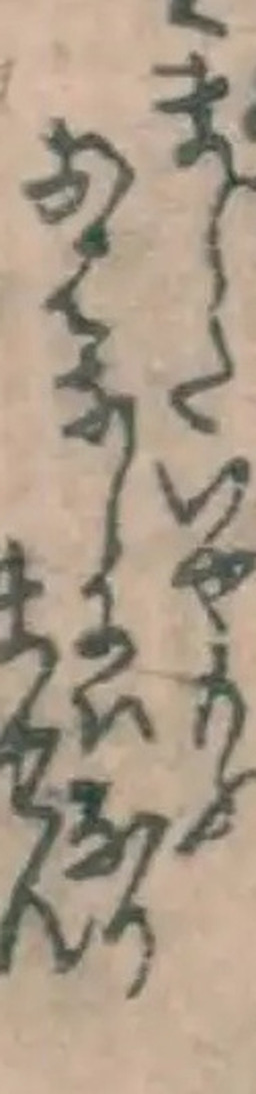おはなしにはなり
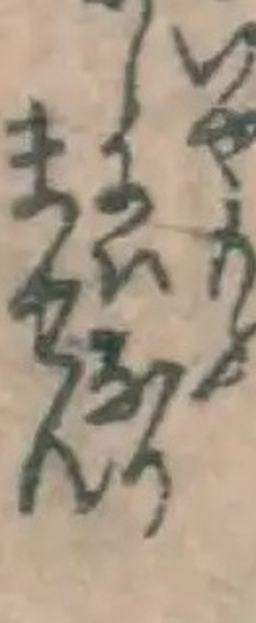ません

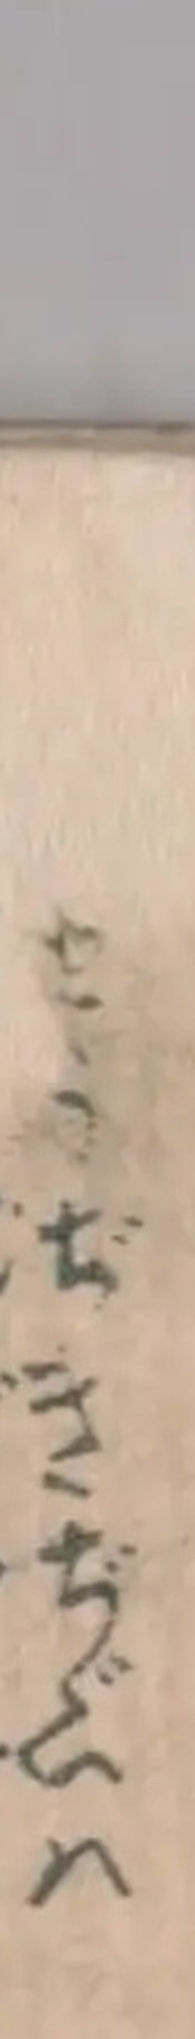せうぢきぢゞいは
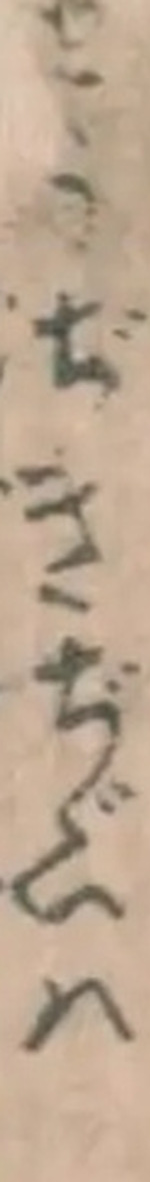せうぢきぢゞいは
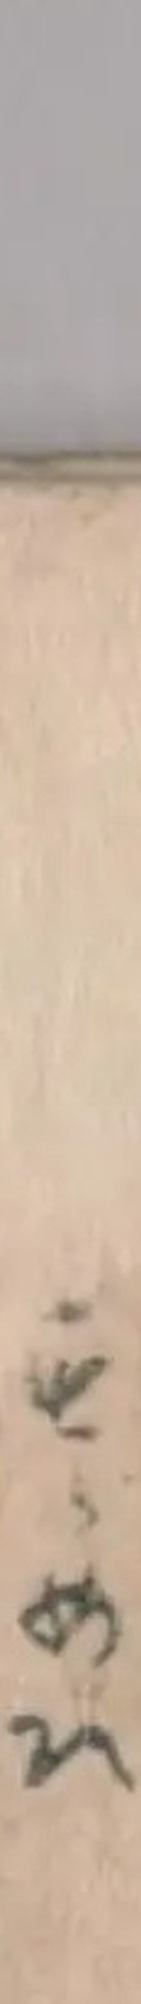すゝめは
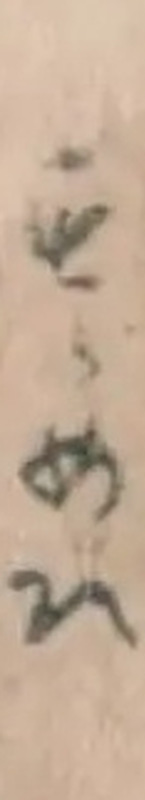すゝめは
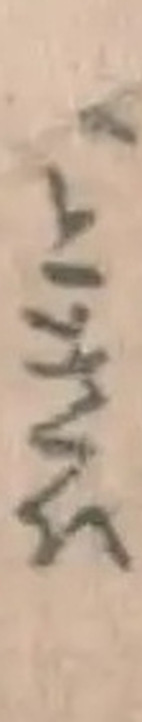ときは
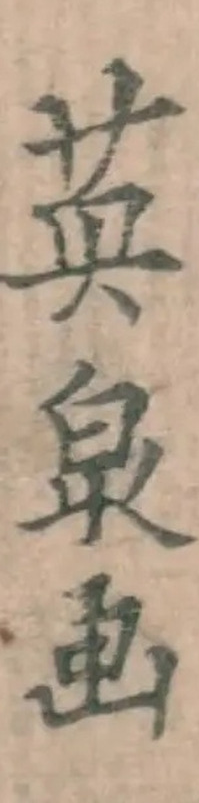英泉画
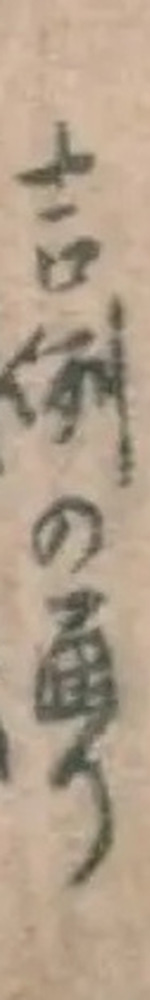吉例の通り
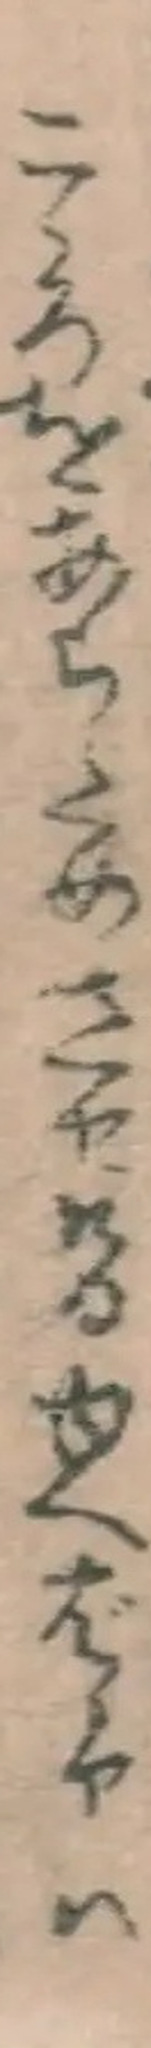こゝろをあらためさせけるゆへばゝあは
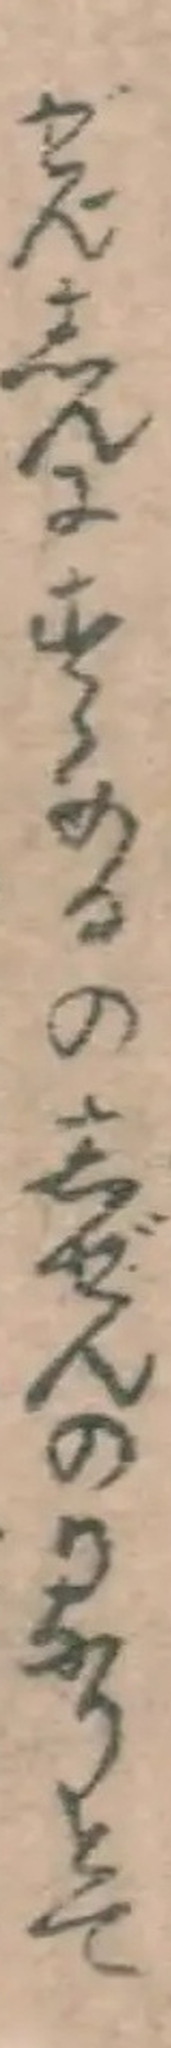ぜんしんにすゝめるのしぜんのりなりとて
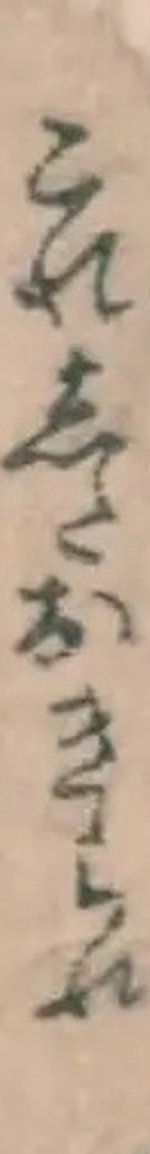これしたおきられ
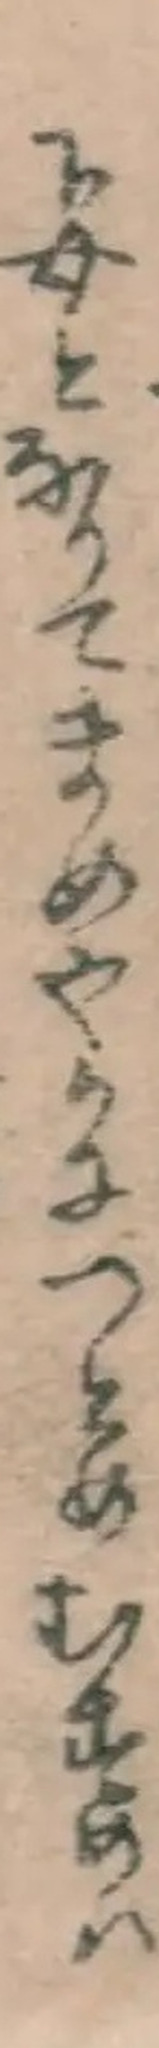下女となりてまめやかにつとめむすめは
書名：舌切雀
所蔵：国立国会図書館 National Diet Library, JAPAN
